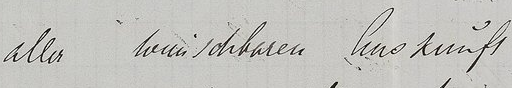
aller wünschbaren Auskunft
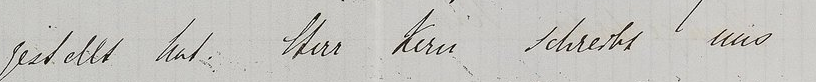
gestellt hat. Herr Kern schreibt uns
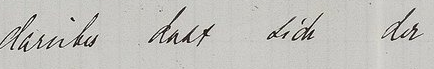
darüber dass sich der
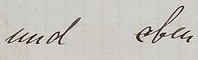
Minister über die
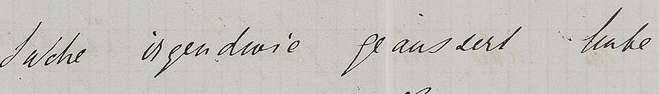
Sache irgendwie geäussert habe
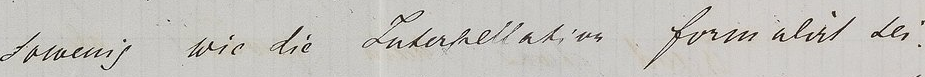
sowenig wie die Interpellation formulirt sei.
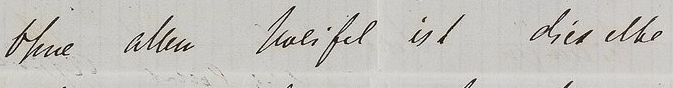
Ohne allen Zweifel ist dieselbe
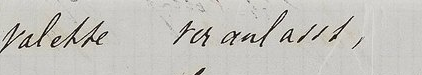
valette veranlasst,
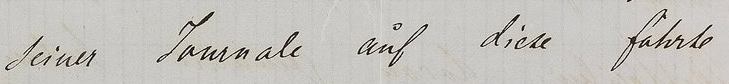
seiner Journale auf diese Fährte
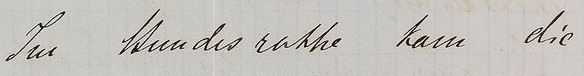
Im Bundesrathe kam die
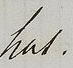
Sache
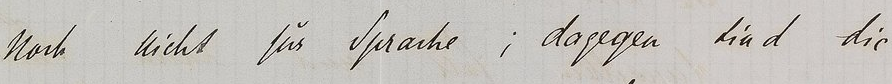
noch nicht zur Sprache; dagegen sind die
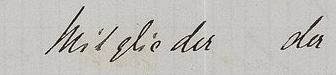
Mitglieder der
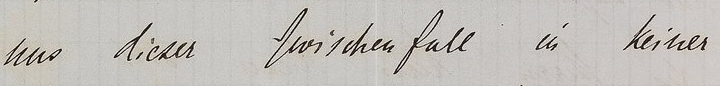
uns dieser Zwischenfall in keiner
